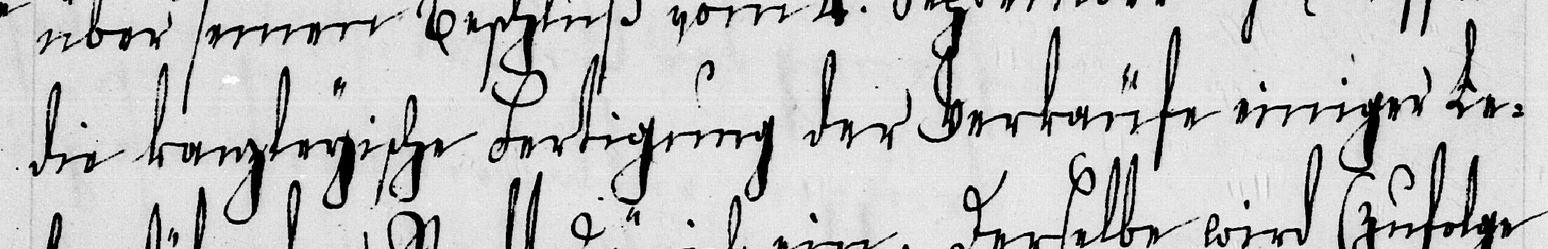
die kanzleyische Fertigung der Verkäufe einiger Le¬
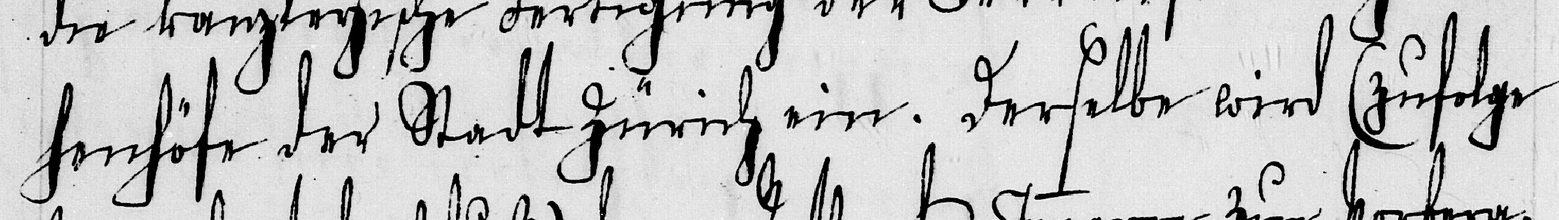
henhöfe der Stadt Zürich ein. Derselbe wird (zufolge
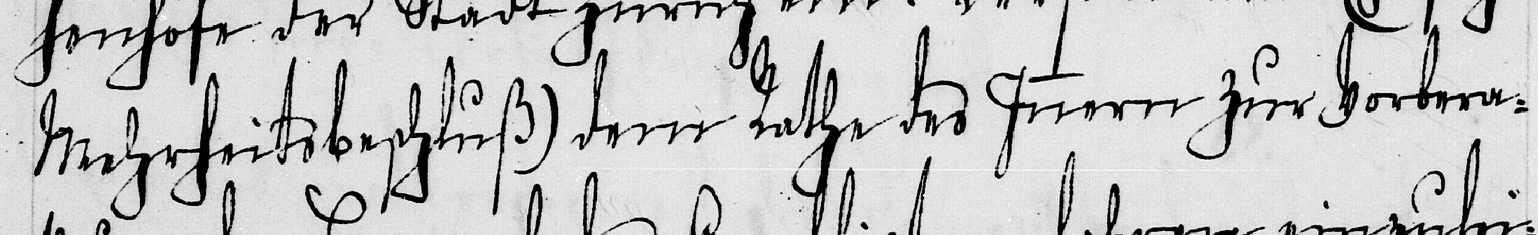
Mehrheitsbeschluß) dem Rathe des Innern zur Vorbera¬
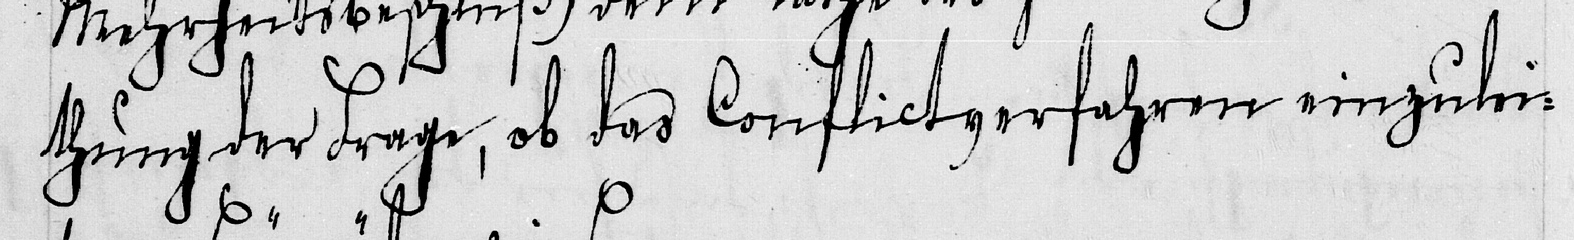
thung der Frage, ob das Conflictverfahren einzulei¬
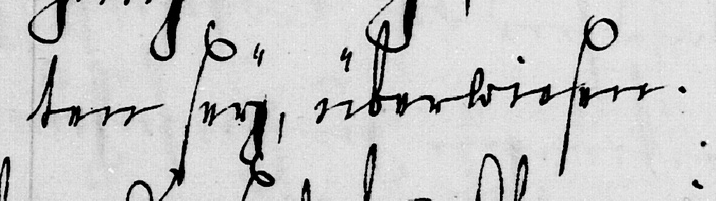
ten sey, überwiesen.
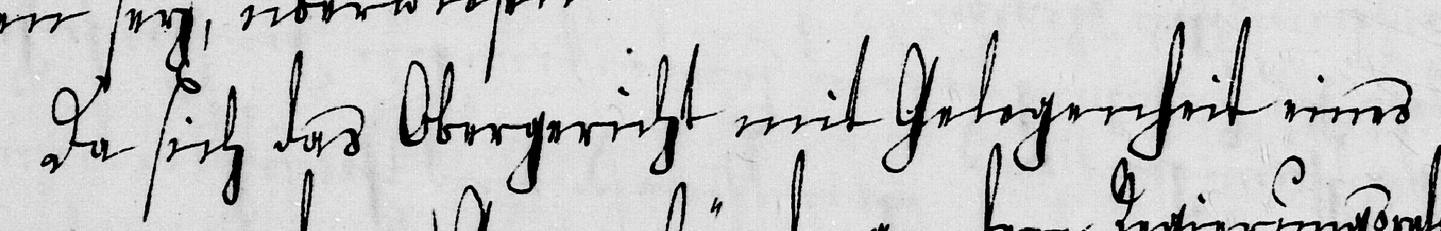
Da sich das Obergericht mit Gelegenheit eines
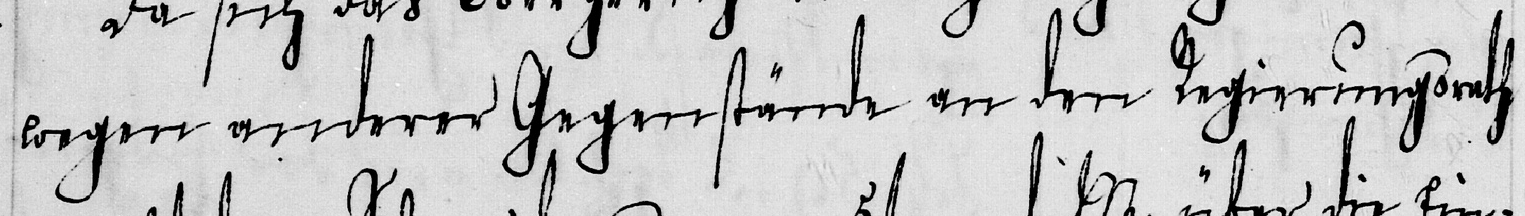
wegen anderer Gegenstände an den Regierungsrath
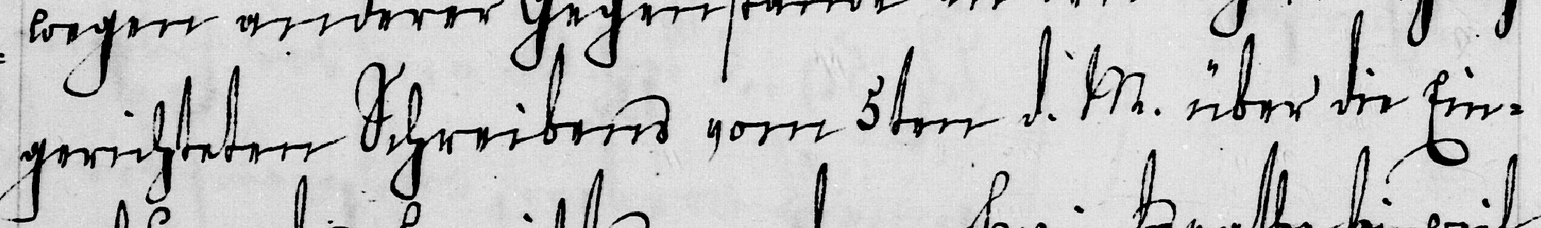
gerichteten Schreibens vom 5ten d. M. über die Ein¬
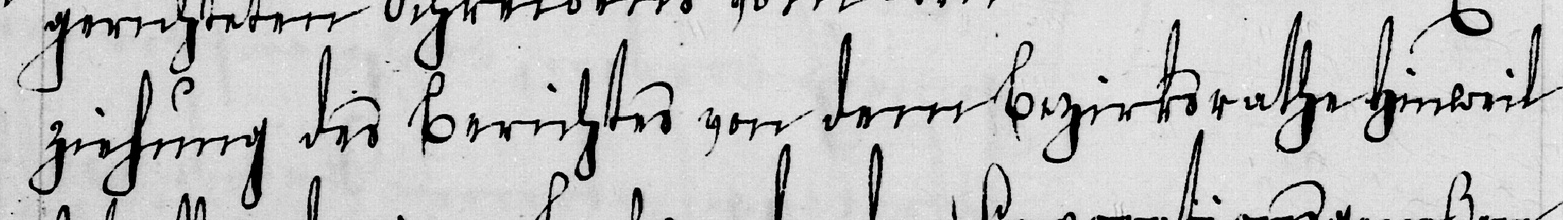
ziehung des Berichtes von dem Bezirksrathe Hinweil
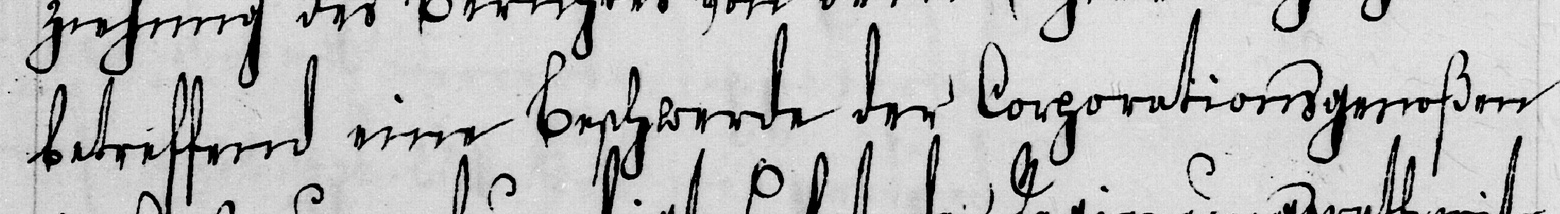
betreffend eine Beschwerde der Corporationsgenoßen
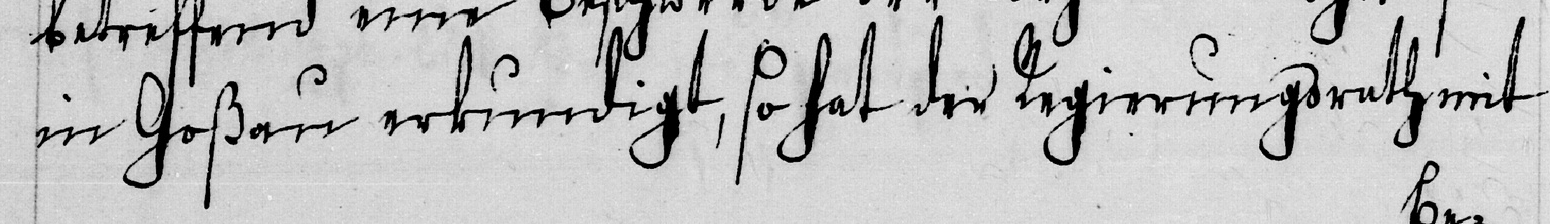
in Goßau erkundigt, so hat der Regierungsrath mit
